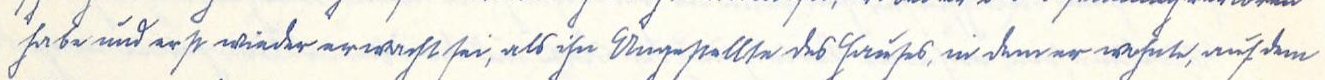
habe erst wieder erwacht sei, als ihn Angestellte des Hauses, indem er wohnte, auf dem
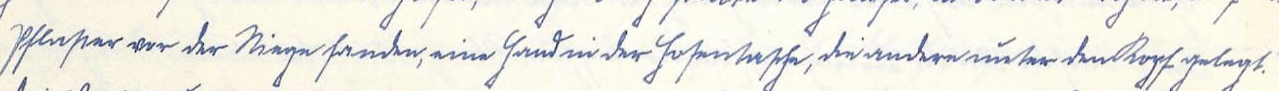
Pflaster vor der Stiege fanden, eine Hand in der Hosentasche, die andere unter den Kopf gelegt.
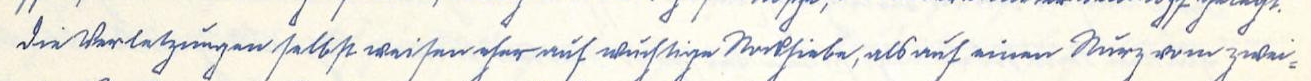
Die Verletzungen selbst weisen eher auf wuchtige Stockhiebe, als auf einen Sturz vom zwei-
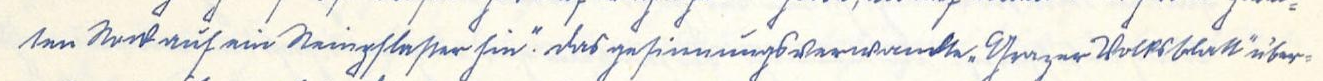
ten Stock auf ein Steinpflaster hin“. Das gesinnungsverwandte Grazer Volksblatt über-
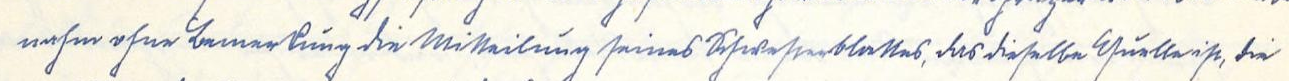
nahm ohne Bemerkung die Mitteilung seines Schwesterblattes, das dieselbe Quelle ist, die
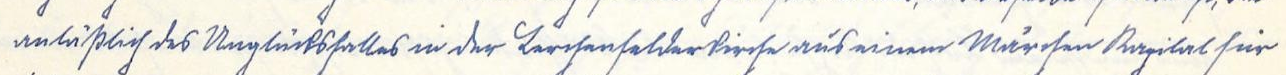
anläßlich des Unglücksfalles in der Lerchenfelderkirche aus einem Märchen Kapital für
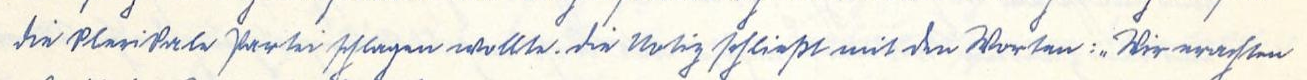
die klerikale Partei schlagen wollte. Die Notiz schließt mit den Worten: „“Wir erachten es
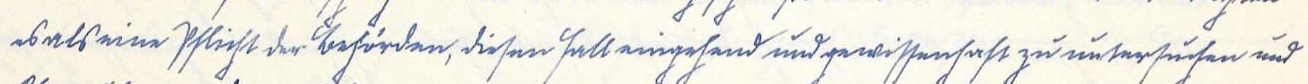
als eine Pflicht der Behörden, diesem Fall eingehend und gewissenhaft zu untersuchen und
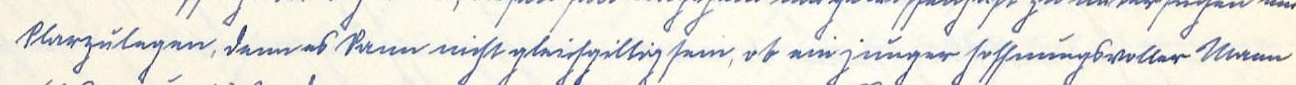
klar zulegen, denn es kann nicht gleichgültig sein, ob ein junger hoffnungsvoller Mann
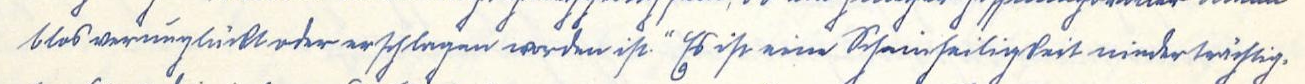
blos verunglückt oder erschlagen worden ist.“ Es ist eine Scheinheiligkeit niederträchtig-
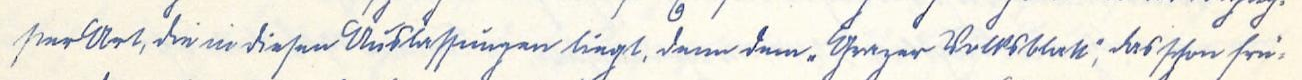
ster Art, die in diesen Auslassungen liegt, den dem „Grazer Volksblatt“ das schon frei
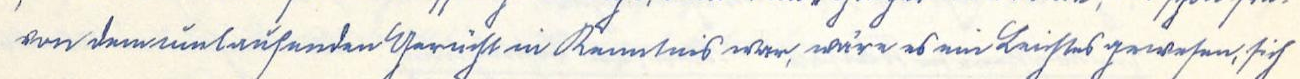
von dem umlaufenden Gerücht in Kenntnis war, wäre es ein Leichtes gewesen, sich
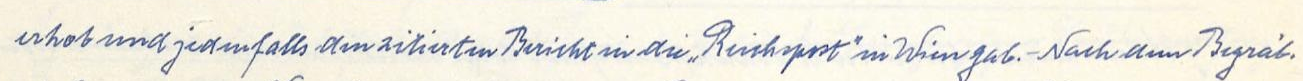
erhob und jedenfalls den zitierten Berichten in die „Reichspost“ in Wien gab. Nach dem Begräb-
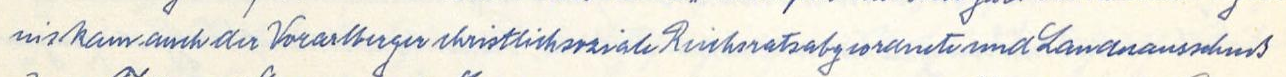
nis kam auch der Vorarlberger christlichsoziale Reichstagsabgeordnete und Landesausschuß
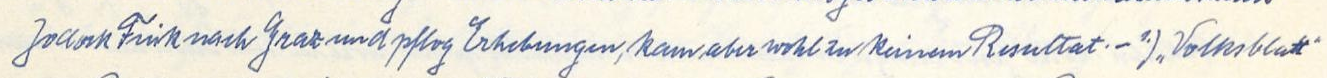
Jodo Fink nach Graz und pflog Erhebungen, kam aber wohl zu keinem Resultat- 1) „Volksblatt“
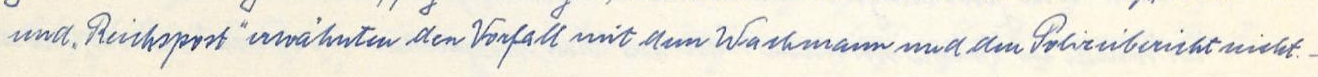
und „Reichspost“ erwähnten den Vorfall mit dem Wachmann den Polizeibericht nicht
